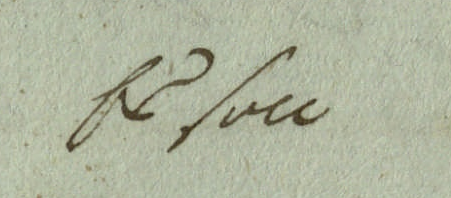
Es soll
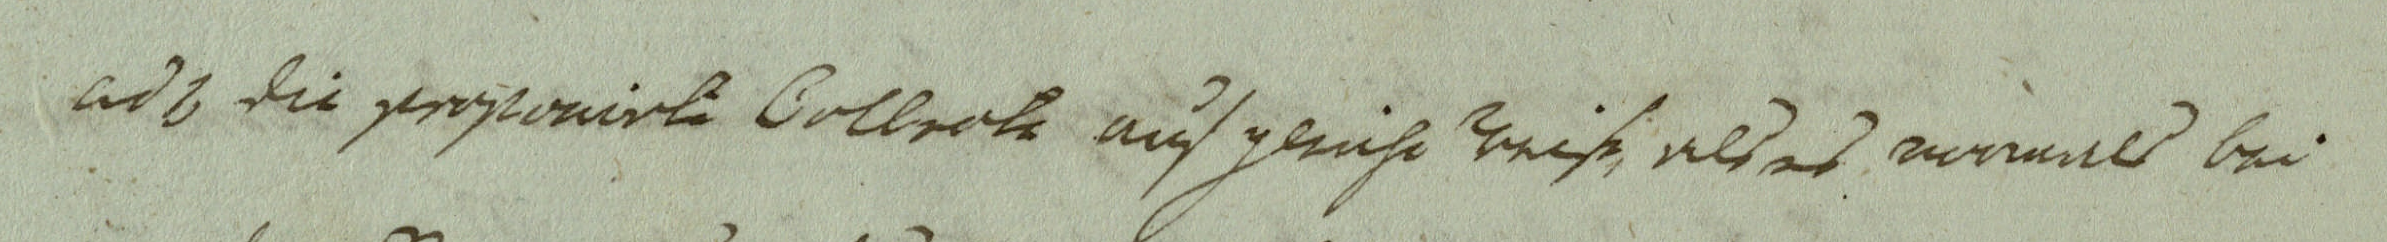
ad 1, die proponirte Collecte auf gleiche Weise, als es vormals bei
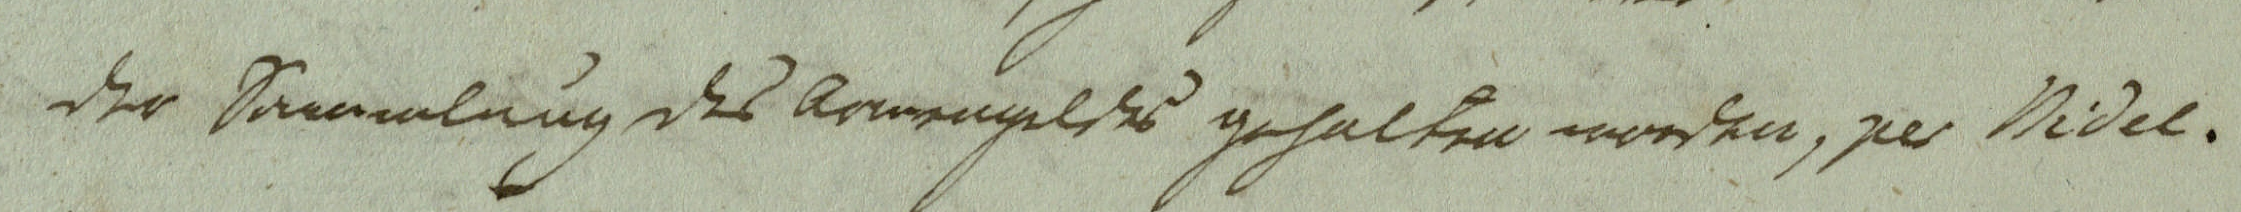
der Sammlung des Armengeldes gehalten worden, per Nidel¬
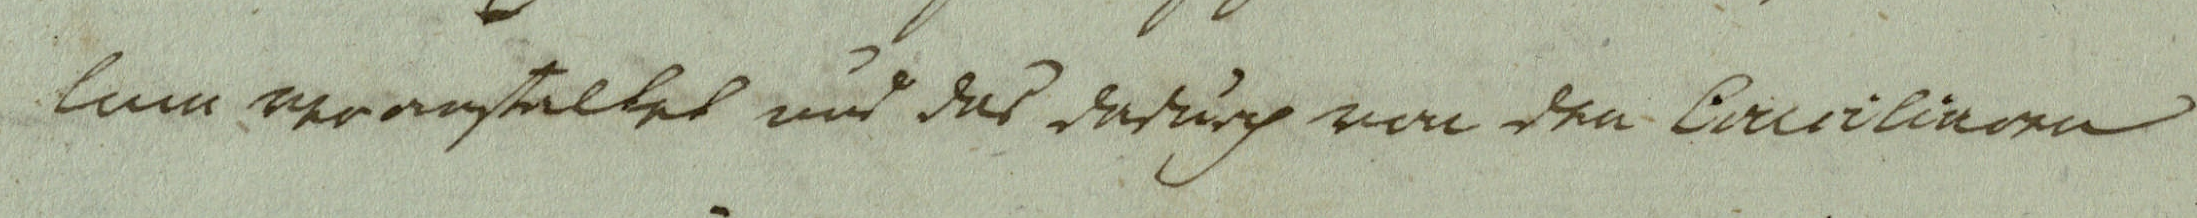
lum veranstaltet und das dadurch von den Conciliaren
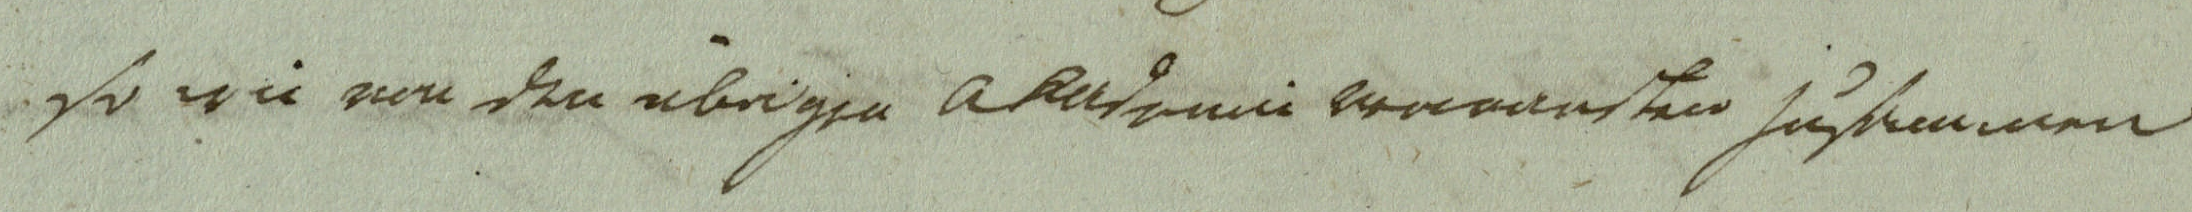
so wie von den übrigen Akademie verwandten zusammen
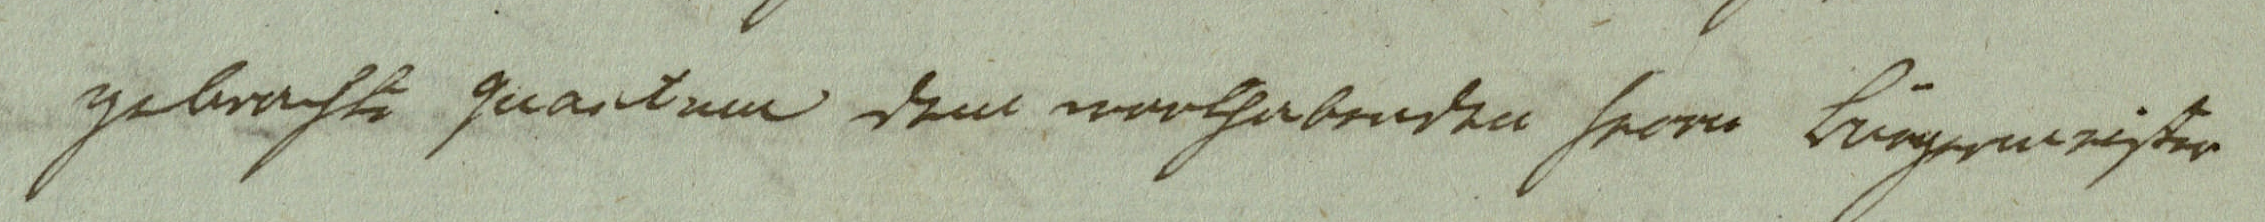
gebrachte Quantum dem worthabenden Herrn Bürgermeister
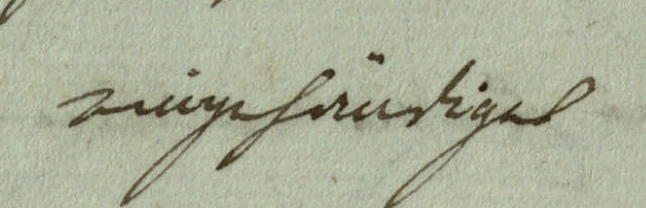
eingehändiget
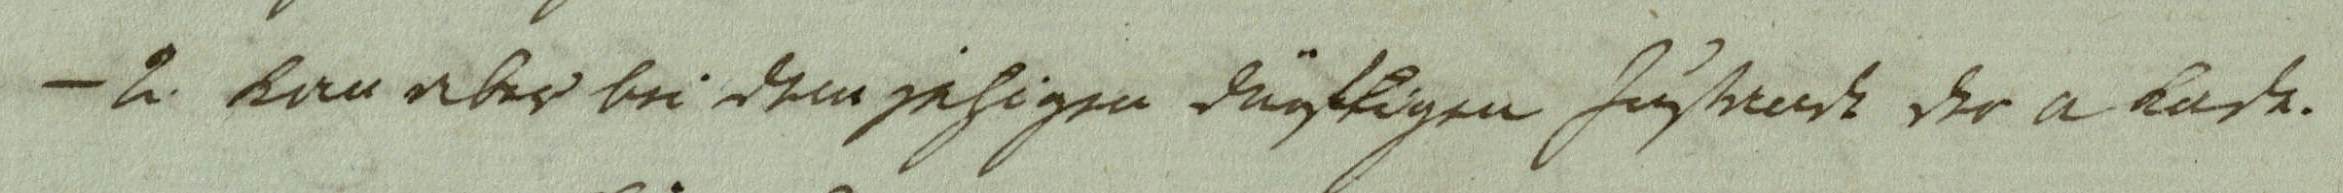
2, kan aber bei dem jetzigen dürftigen Zustande der akade¬
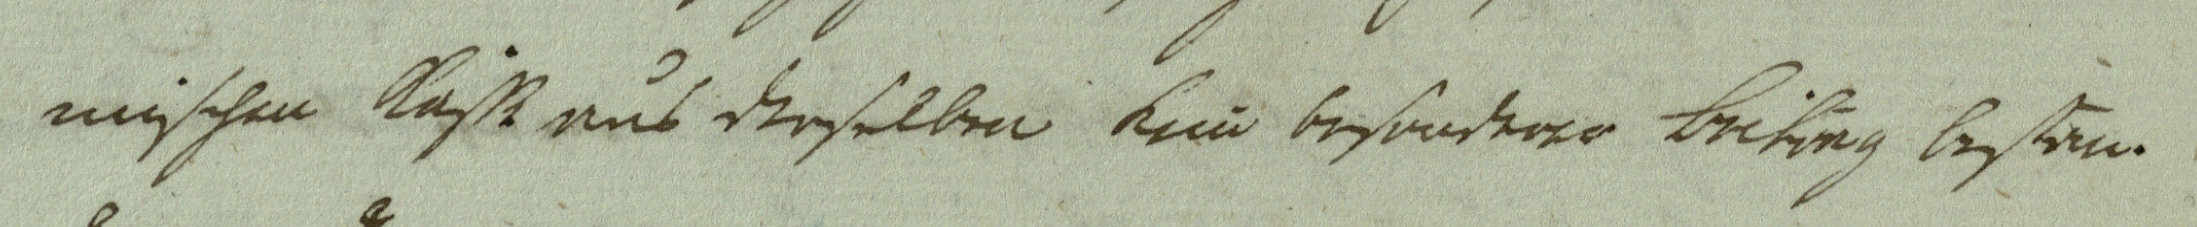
mischen Kasse aus derselben kein besonderer Beitrag bestan¬
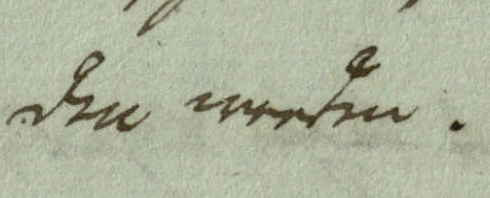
den werden.
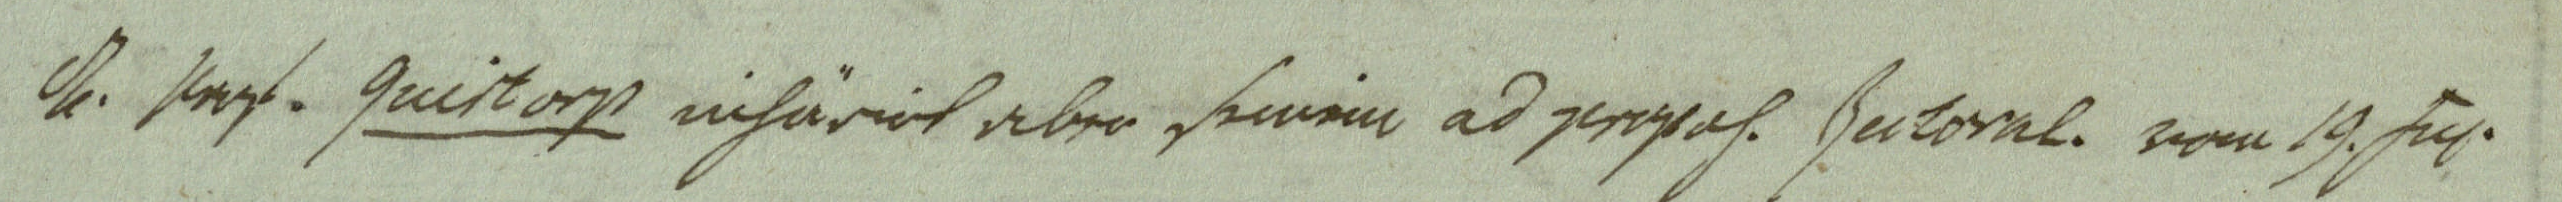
M. D. Prof. Quistorp inhärirt aber seinem ad propos. Rectorat. vom 19. Jul.
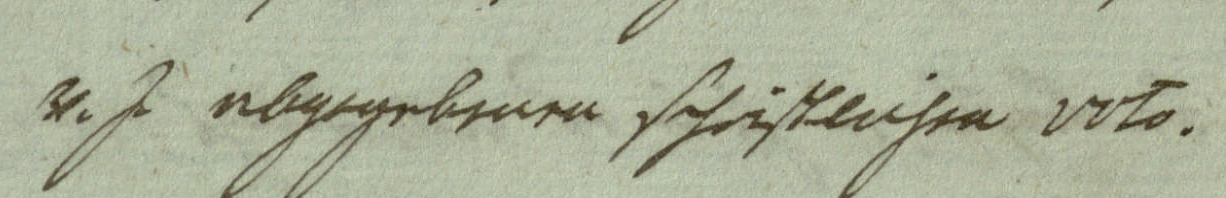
v. J. abgegebenen schriftlichen voto.
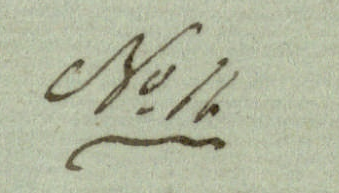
Nº 11.
